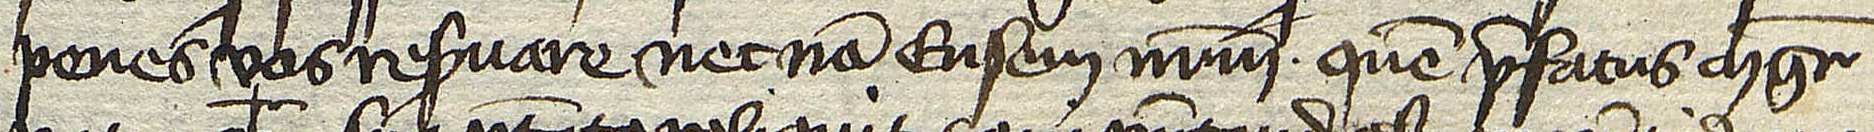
penes vos reſ*uare necno* Enſem n*r*m que* p*fatus M*g*r
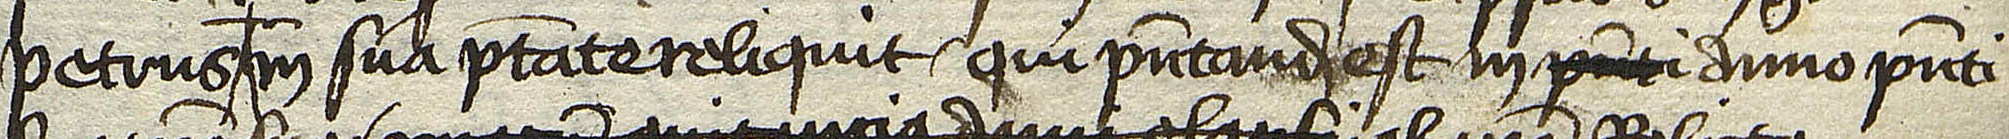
Petrus in ſua p*tate reliquit / qui p*ntand* eſt in pnti* Anno p*nti
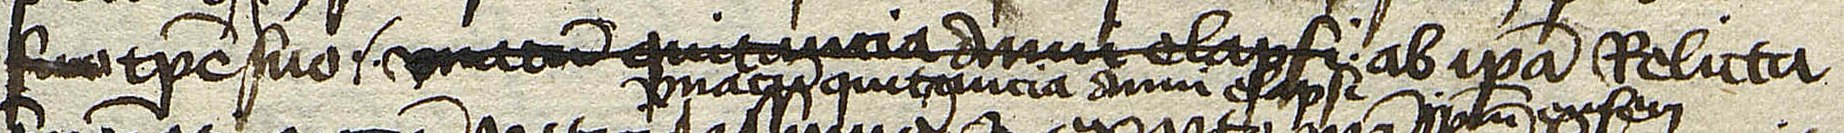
ſuo t*p*e ſuo . / . vnacu* quitancia Anni elapſi . ab ip*a Relicta
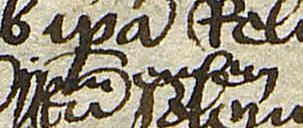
ip*m enſem
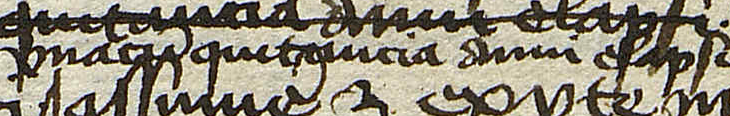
vnacu* quitancia Anni elapſi
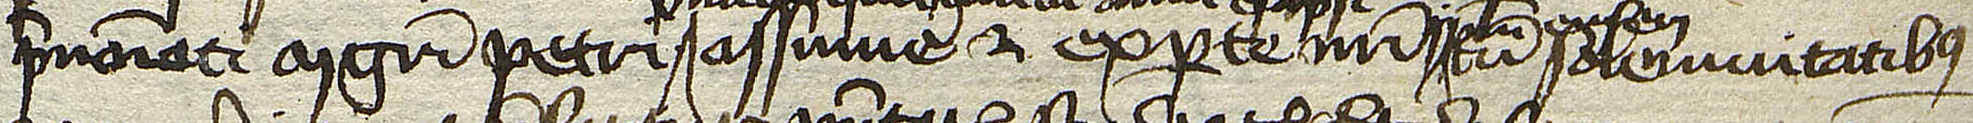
p*no*ati M*g*ri Petri aſſume* @ exp*te n*ri cu* ſolemnitatib*
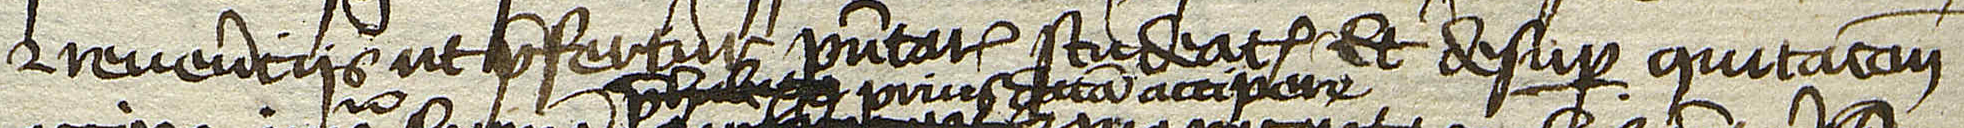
@ reue*ntiis ut p*ſertim p*ntar* ſtudeat* / Et deſup* quita*c*am
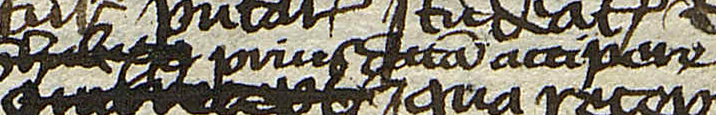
%%%%% prius data* accipere
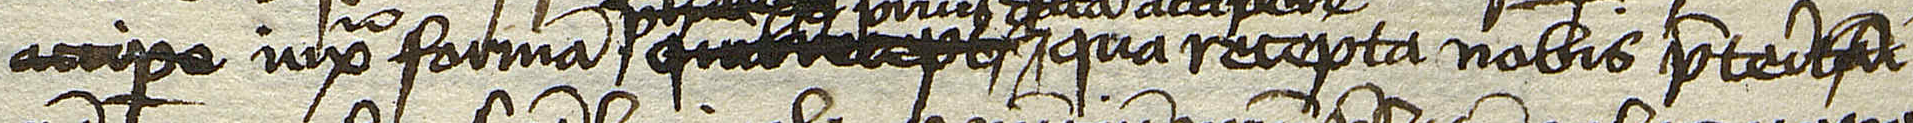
accipe iux* forma* %%%%%% qua recepta nobis p*te*ta
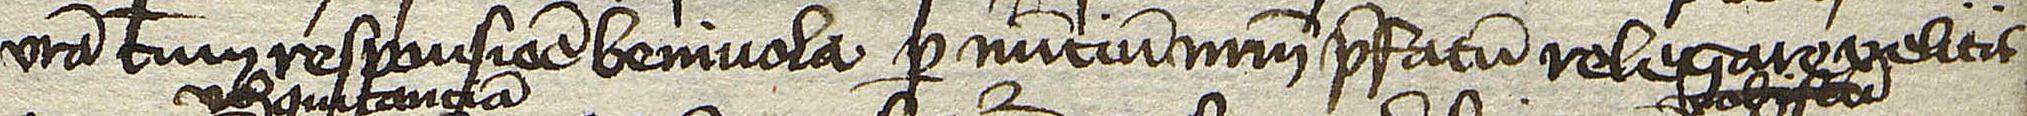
v*ra cum reſponſio*e beniuola p* nu*ciu* n*r*m p*fatu* religare velitis
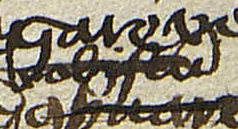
vobiſcu*
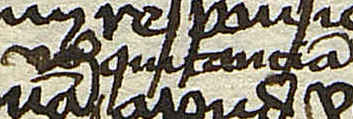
vo quitancia*
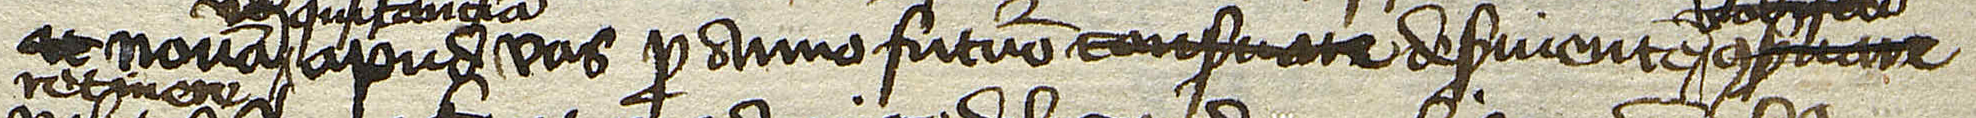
ac noua* apud vos p* Anno futu*o conſ*uare deſ*uiente *ſ*uare
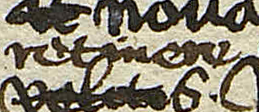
retinere
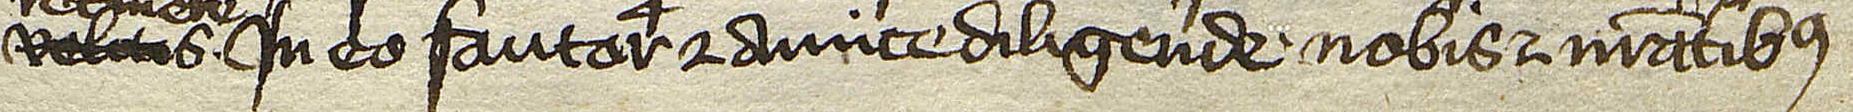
velitis In eo fautor @ Amice diligende nobis @ n*ratib*
